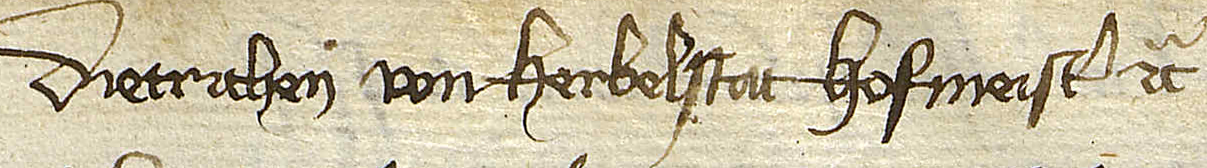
Dietrichen von Herbelſtat hofmeiſt* ec*
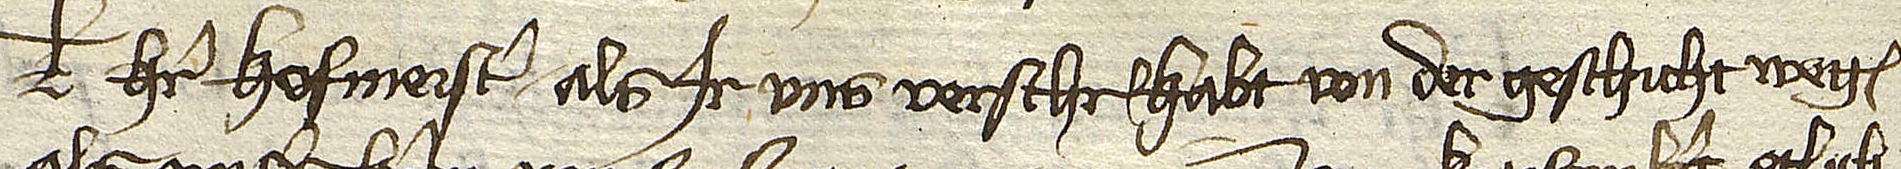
L* h*r Hofmeiſt* / als Ir vns verſchr* habt von der geſchicht weg*
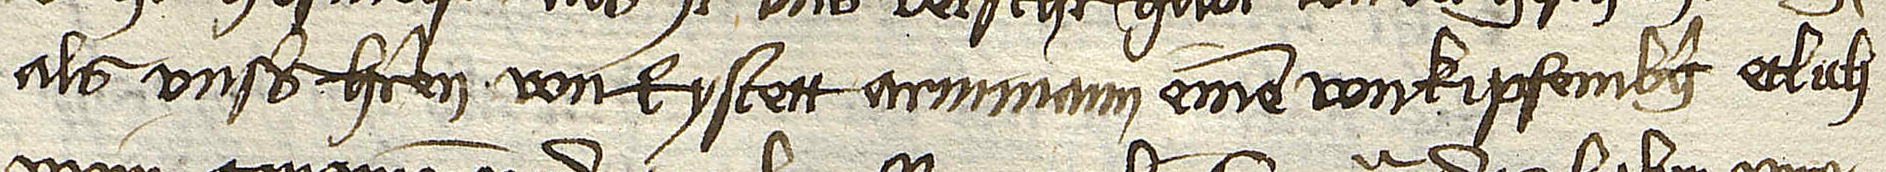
als vnſ*s h*ren von Eyſtett armmann eine* von kipfemb*g etlich
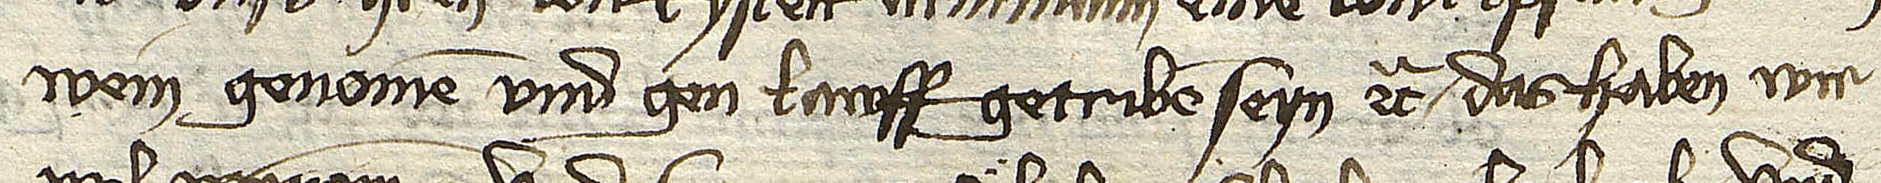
wein genome* vnd gen lawff getribe* ſeyn ec* / das haben wir
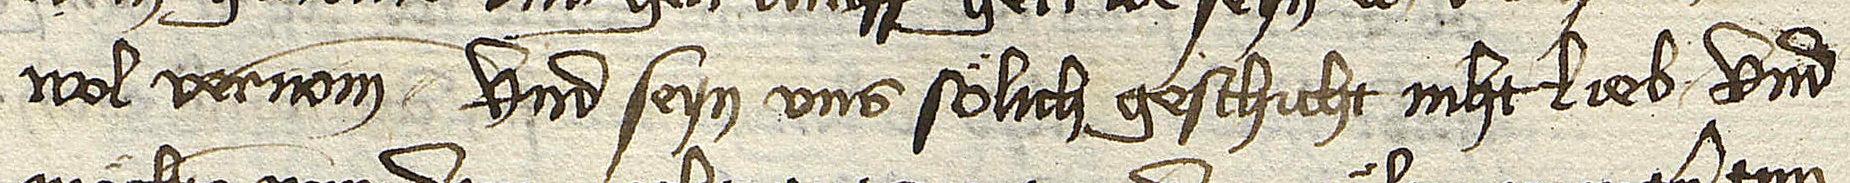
wol vernom* / Vnd ſeyn vns ſölich geſchicht niht lieb / Vnd
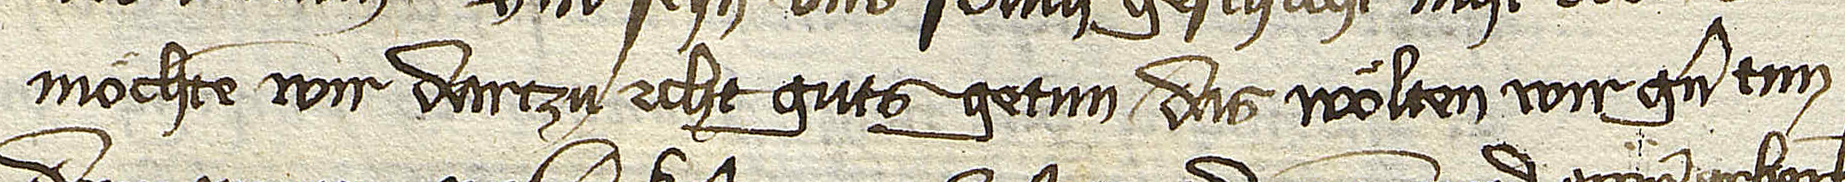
möchte* wir darcʒu icht guts getun / das wölten wir g*n tun
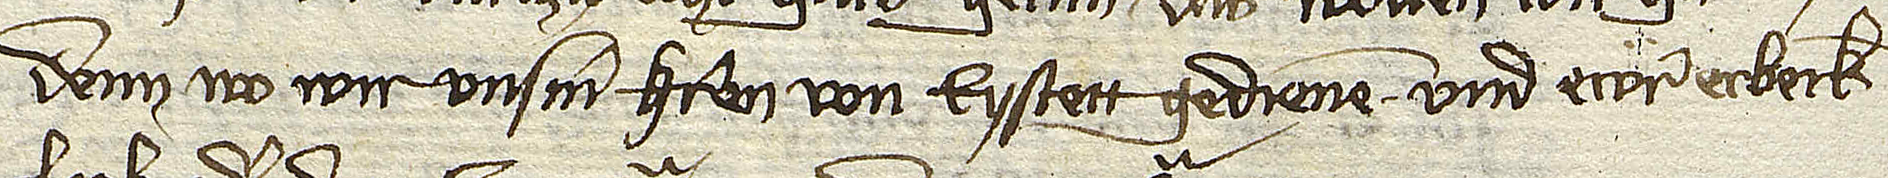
Denn wo wir vnſ*m h*ren von Eyſtett gediene* . vnd ew*r erberk*
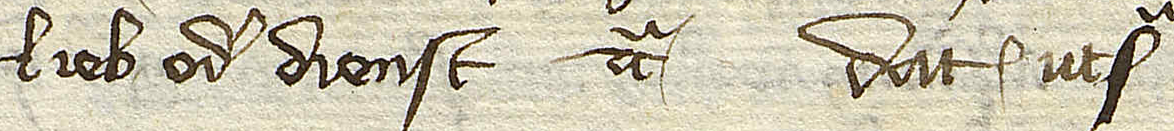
lieb od* dienſt ec* Dat* ut ſ*
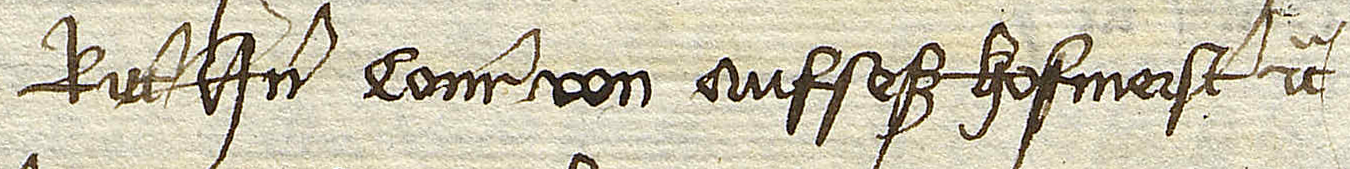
Ritt* H*n Conr* von Aufſeſʒ hofmeiſt* ec*
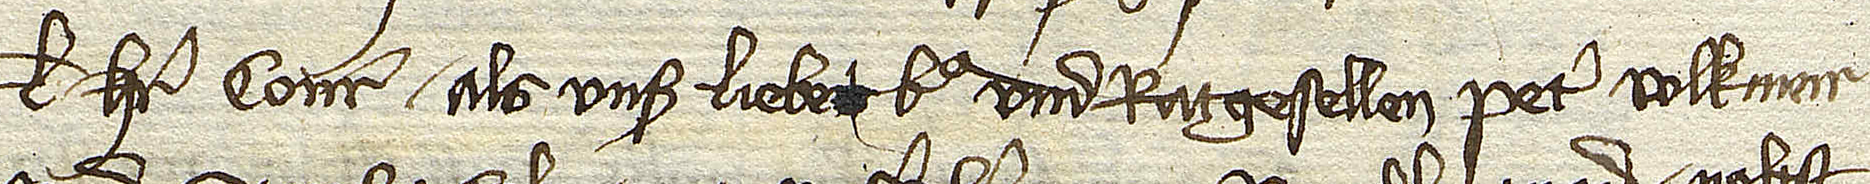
L* h*r Conr* / als vnſ* lieber b* vnd Ratgeſellen Pet* volkmeir
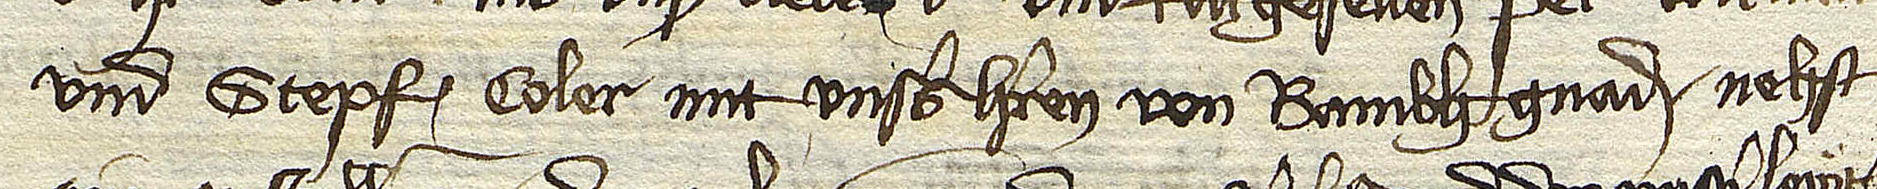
vnd Stepf* Coler mit vnſ*s h*ren von Bamb*g gnad* nehſt
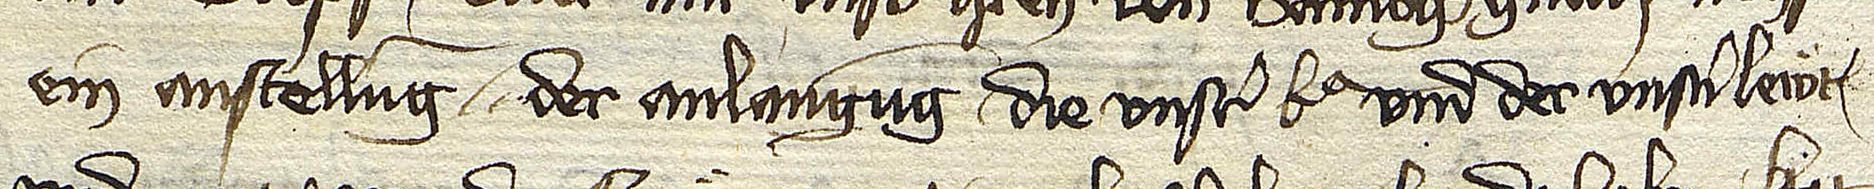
ein anſtellu*g / der anlangu*g / die vnſ*r b* vnd der vnſ*n lewt*
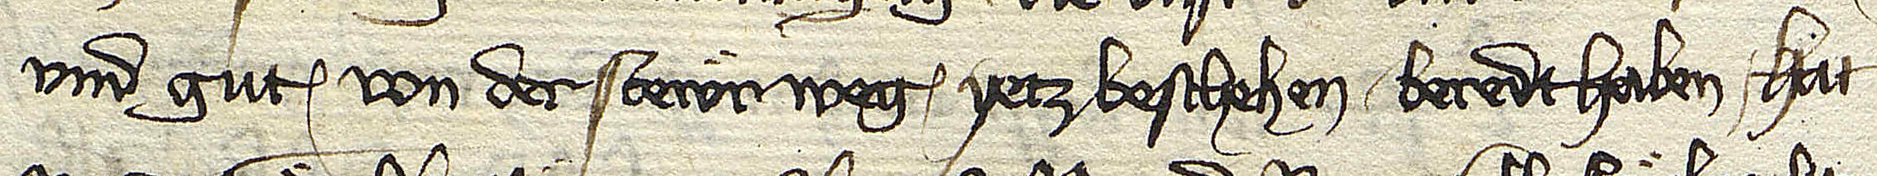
vnd gut* von der ſtewr weg* yecʒ beſchehen / beredt haben / hat
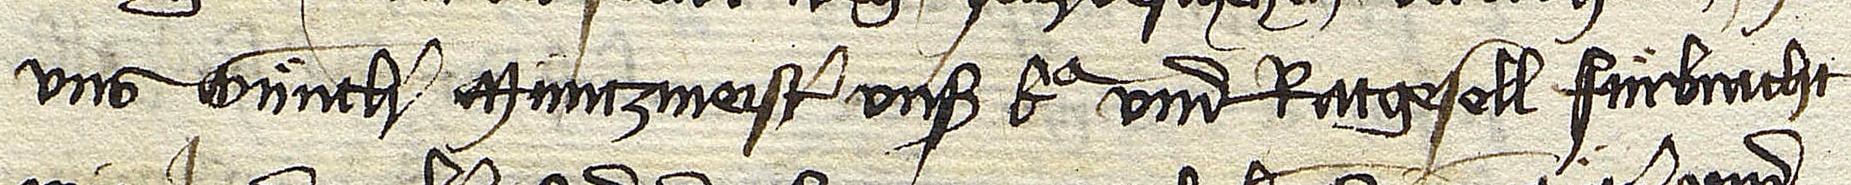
vns Günth* Müncʒmeiſt* vnſ* b* vnd Ratgeſell fürbracht
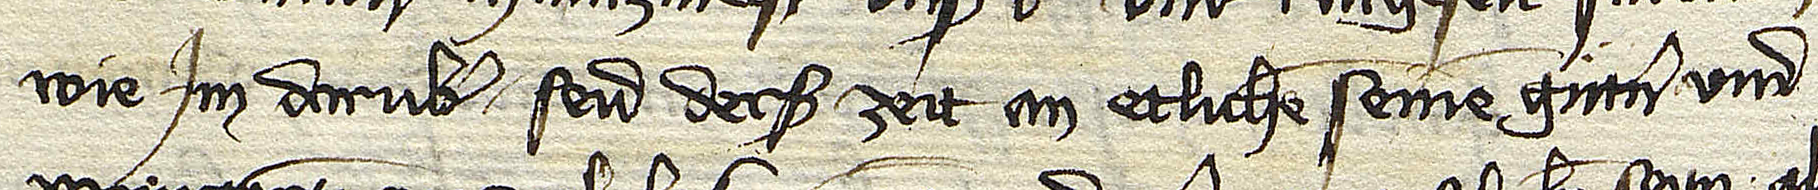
wie Im darub* / ſeid derſ* ʒeit an etliche* ſeine* gütn* vnd
